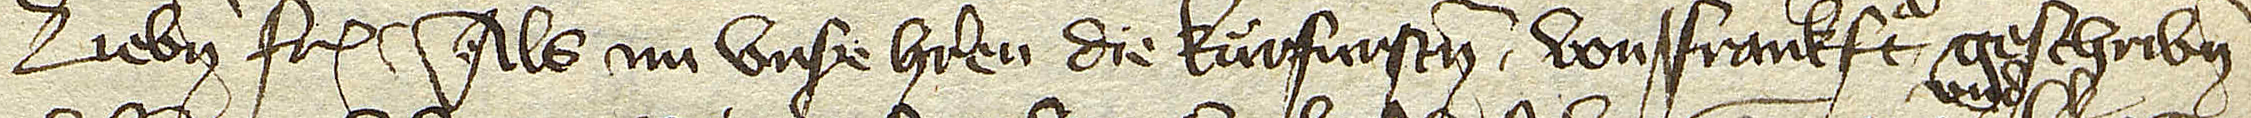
Liebn* fr* / Als nu vnſ*e hr*en die kürfurſtn* / von frankf*t geſchribn*
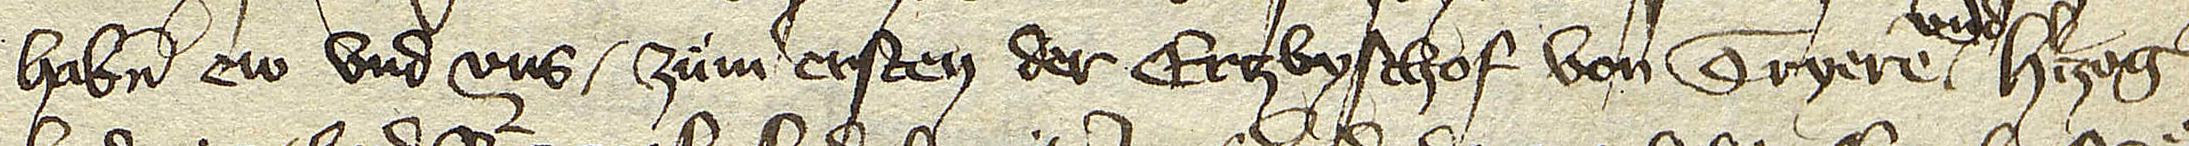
habn* ew vnd vns / cʒüm erſten der Ercʒbyſchof von Tryere / h*cʒog
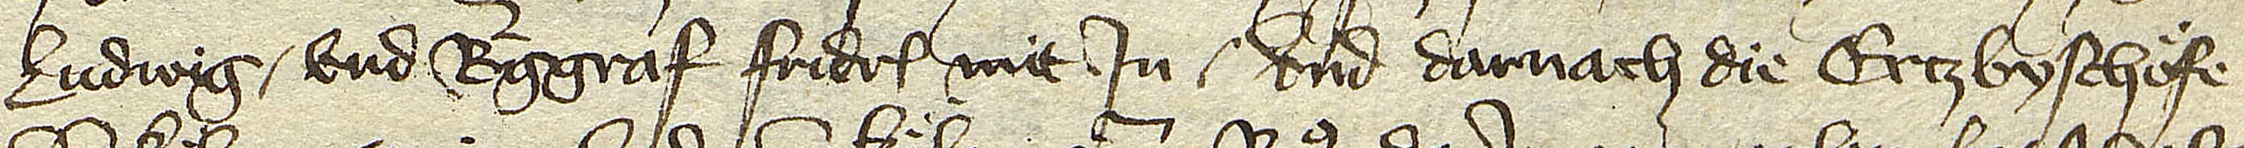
Ludwig / vnd B*ggraf fridr* mit In / vnd darnach die Ercʒbyſchöfe
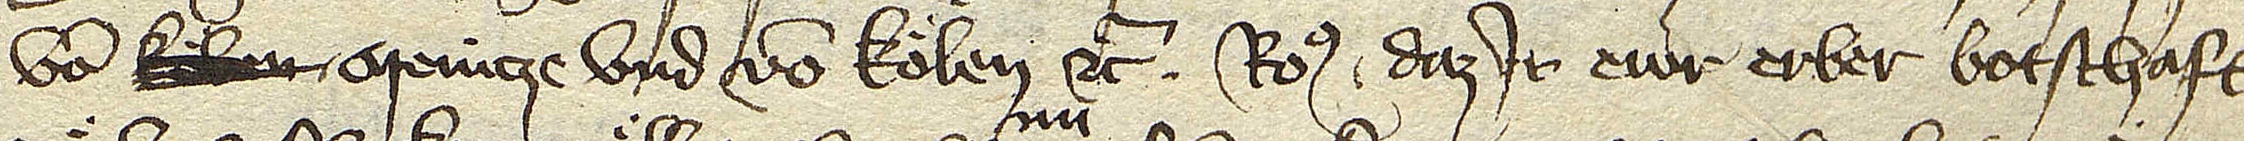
vo* Kölen / Meincʒe vnd vo* Kölen ec* . Ro* / daʒ Ir ewr erber botſchaft
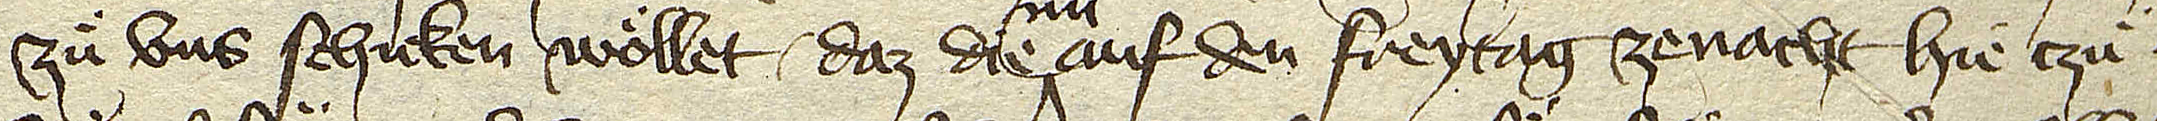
cʒü vns ſchicken wöllet / daʒ die auf den freytag cʒenacht hie cʒü
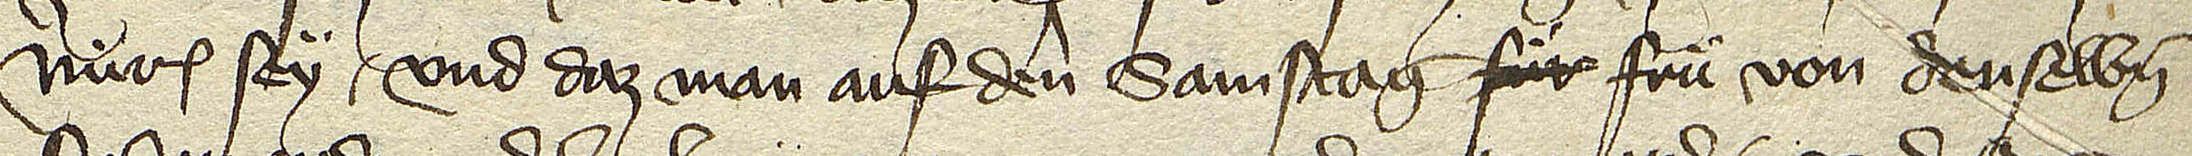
Nür* ſey / vnd daʒ man auf den Samſtag für frü von denſelbn*
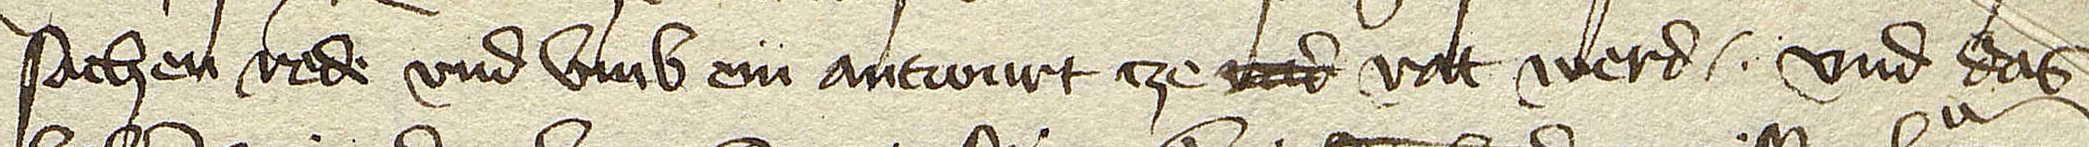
ſachen rede vnd vmb ein anwurt cʒe rad rat wer / . vnd das
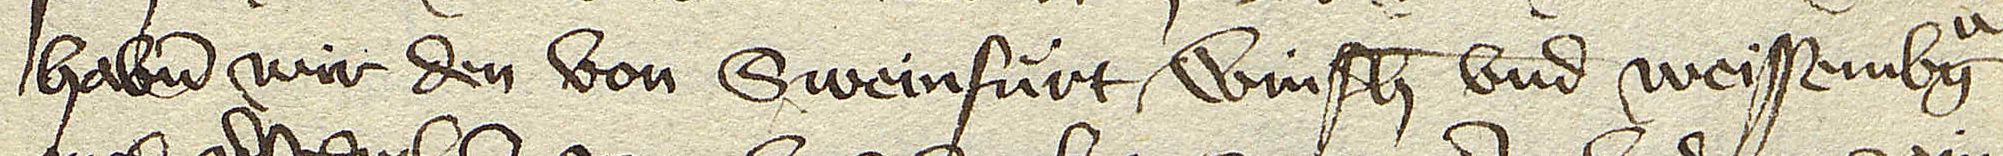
habn* wir den von Sweinfürt / Winſh* vnd weiſſemb*g
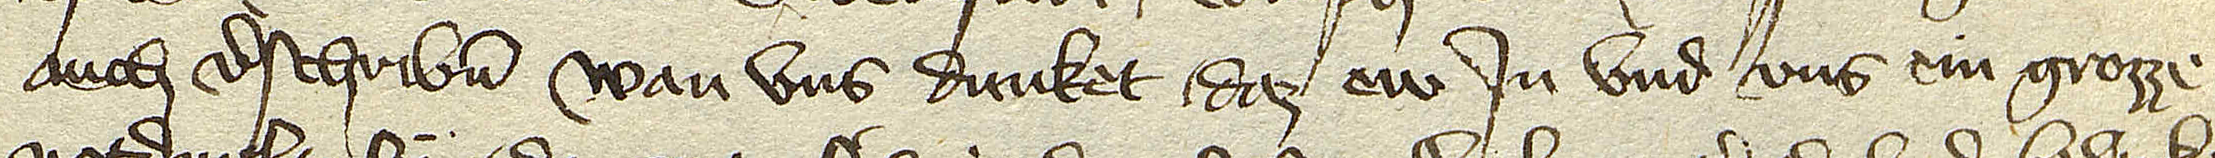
auch v*ſchribn* wan vns dunket / daʒ In vnd vns ein groʒʒe
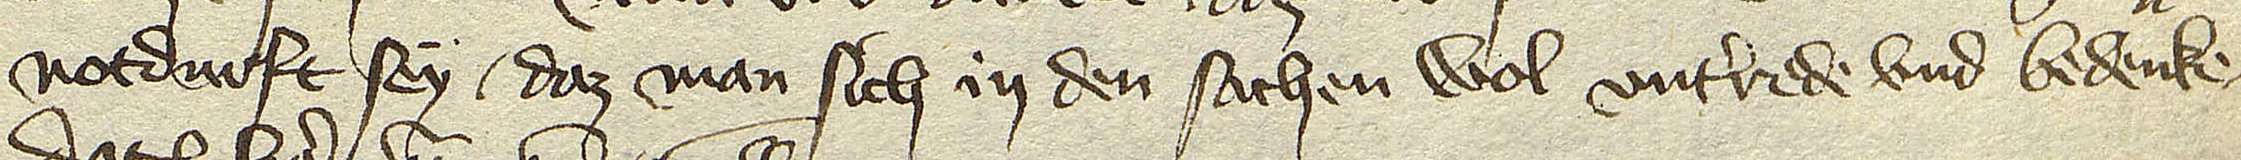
notdurft ſey / daʒ man ſich in den ſachen wol vnt*rede vnd bedenke /
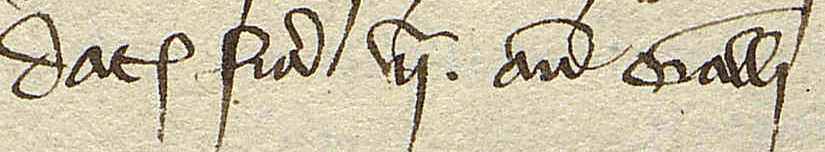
Dat* fia* ii* . an* Galli*
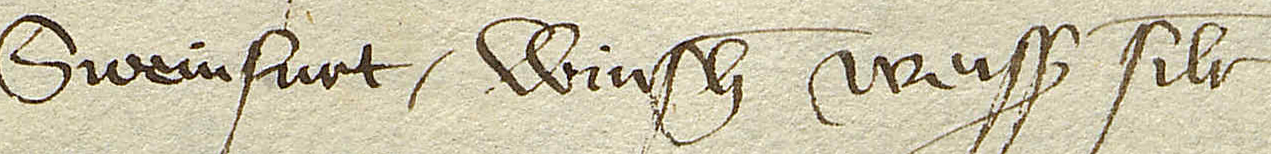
Sweinfurt / Winſh* weiſſ* ſilr*
